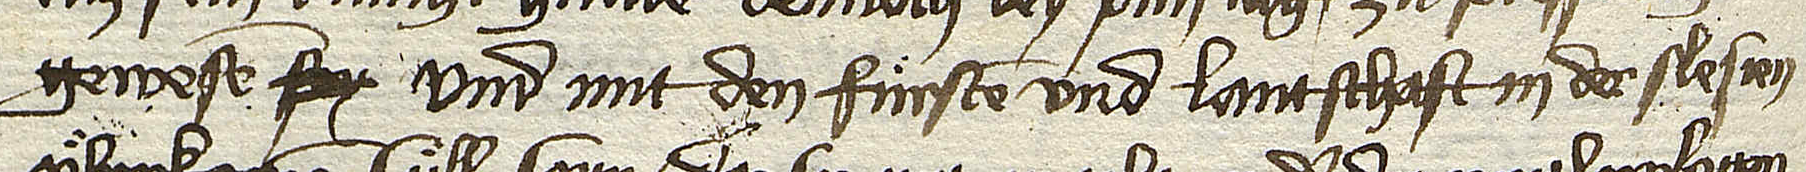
geweſe* ſey vnd mit den fürſte* vnd lantſchaft in der ſleſien
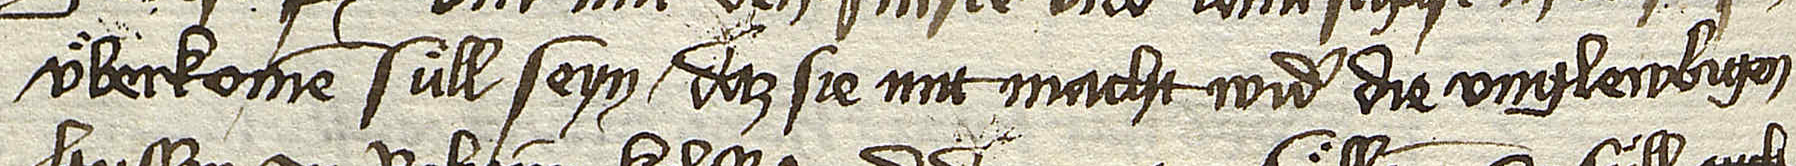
v̈berkome* ſüll ſeyn / daʒ ſie mit macht wid* die vnglewbigen
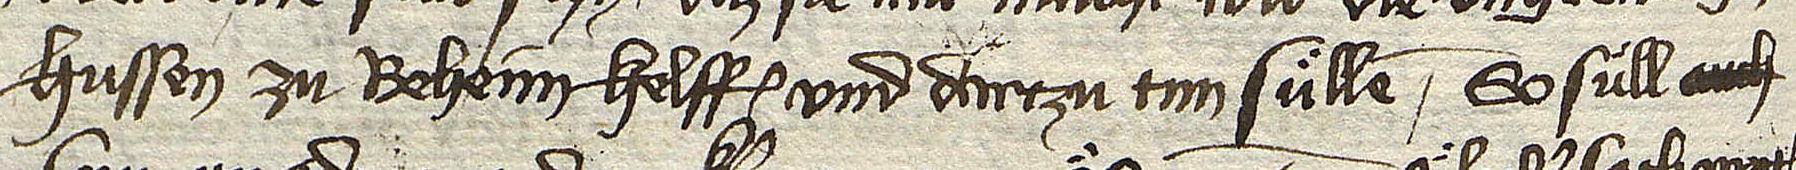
Huſſen ʒu Beheim helff* vnd darcʒu tun ſülle* / So ſüll auch
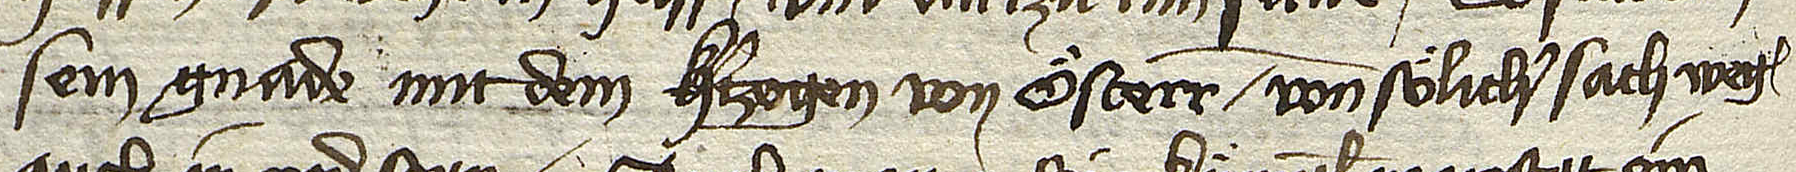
ſein gnade mit dem h*cʒogen von Öſterr* / von ſölich* ſach weg*
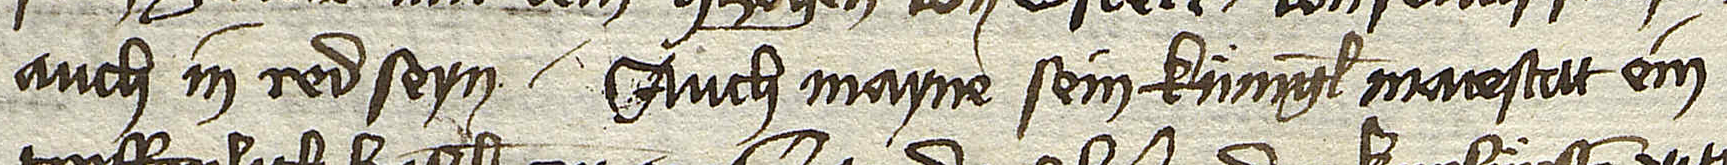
auch in red ſeyn / Auch mayne ſein künigl* maieſtat ein
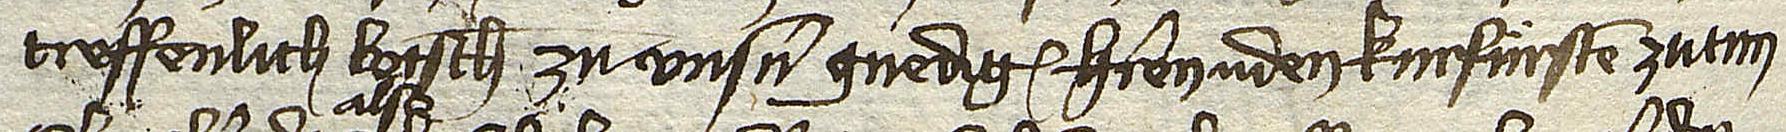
treffenlich botſch* ʒu vnſ*n gnedig* h*ren ~ den kurfürſte* ʒu tun
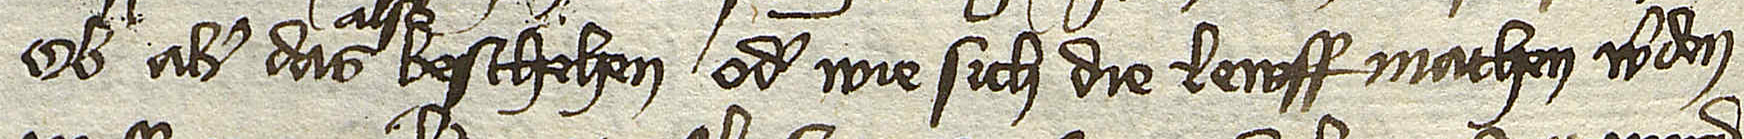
Ob ab* das beſchehen od* wie ſich die lewff machen w*den
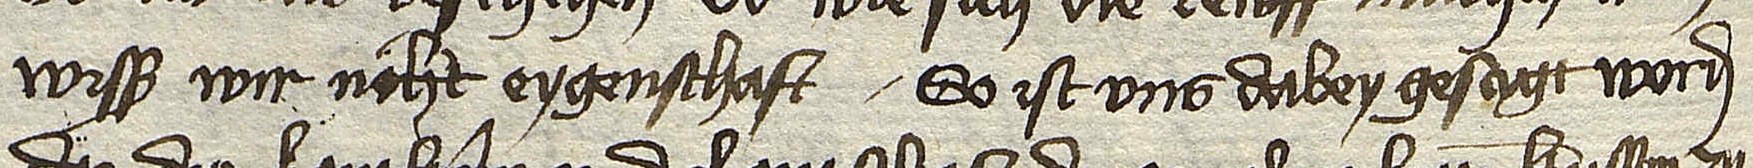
wiſſ* wir niht eygenſchaft / So iſt vns dabey geſagt word*
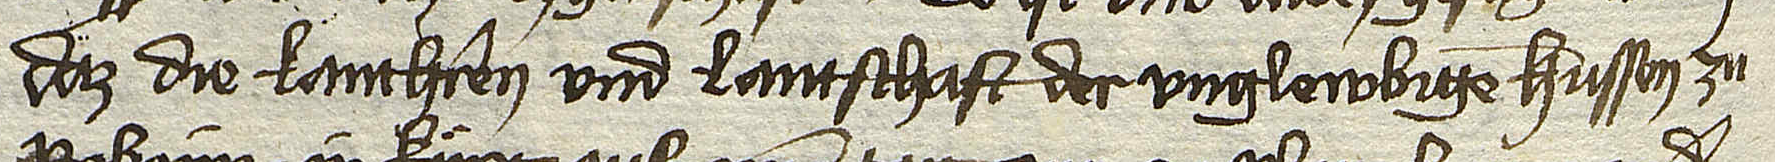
daʒ die lanth*ren vnd lantſchaft der vnglewbige* Huſſen ʒu
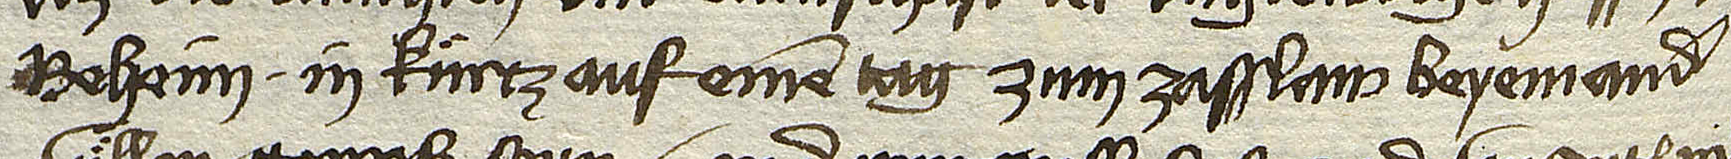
Beheim . in kürcʒ auf eine* tag ʒum ʒaſſlaw beyeinand*
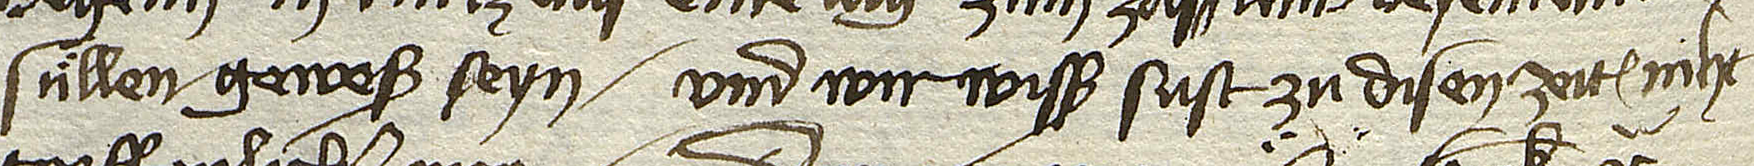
ſüllen geweſ* ſeyn / vnd wir wiſſ* ſuſt ʒu diſen ʒeit* niht
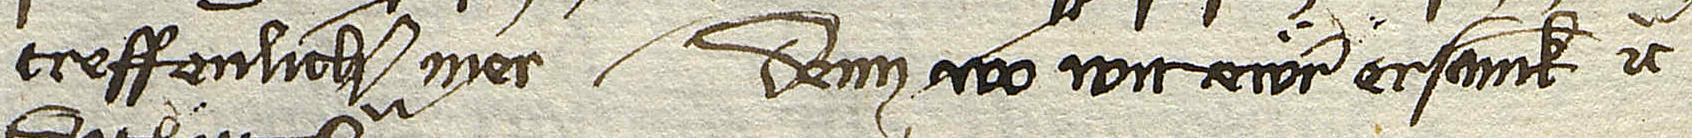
treffenlich* mer / Denn wo wir ewr* erſamk* ec*
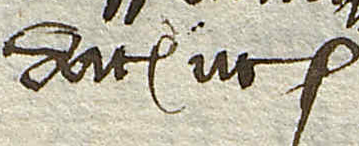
dat* ut ſ*
